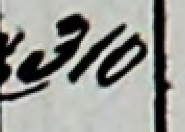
310
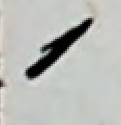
1
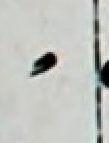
„
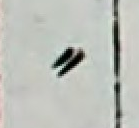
„
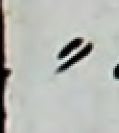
„
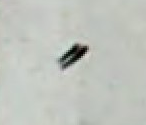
„
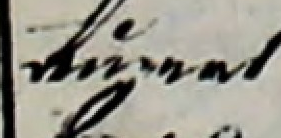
Rural
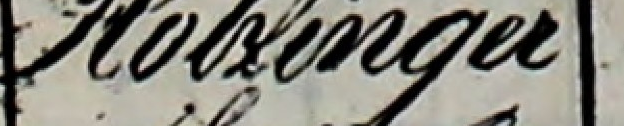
Holzinger
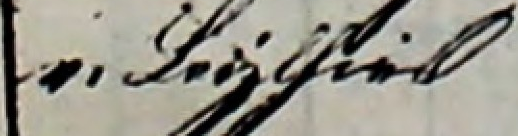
v. Leizthies
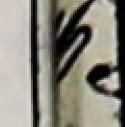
16
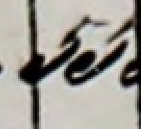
55
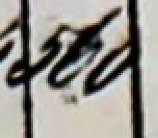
560
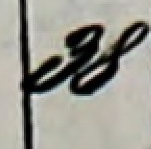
38
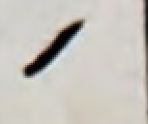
1
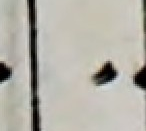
„
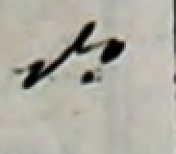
Do
